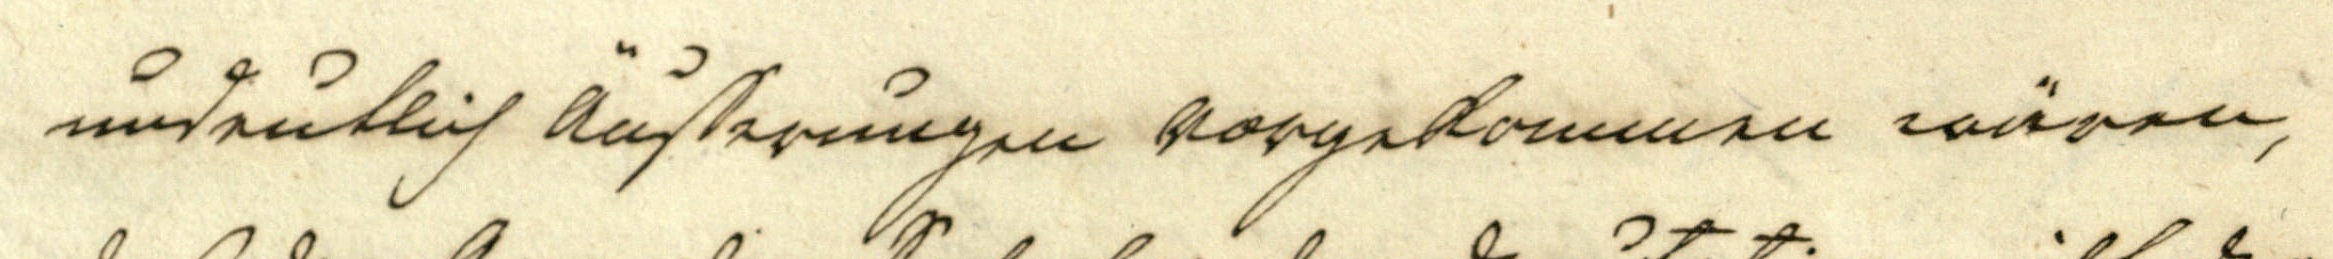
undeutlich Äusserungen vorgekommen wären,
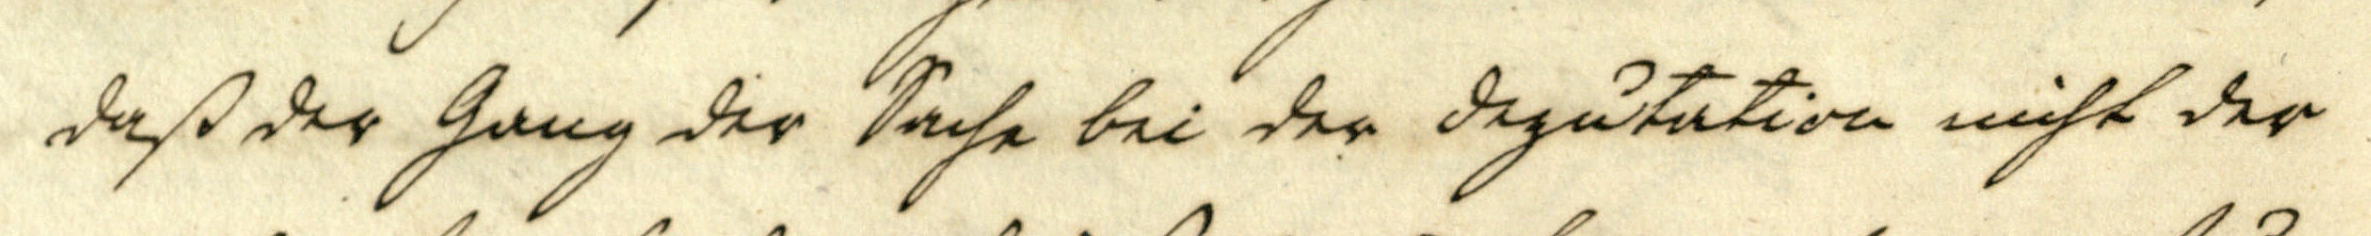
daß der Gang der Sache bei der Deputation nicht der
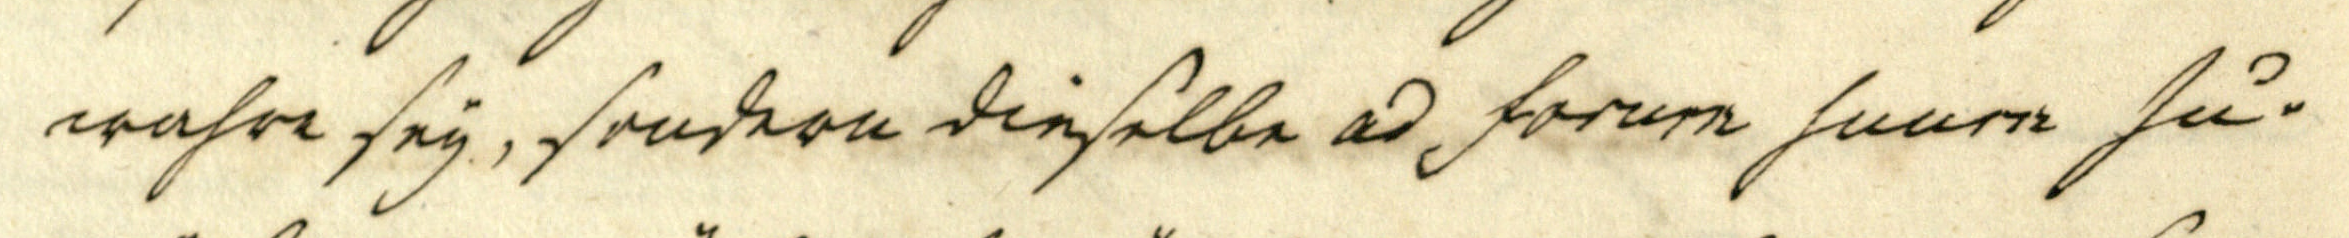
wahre seÿ, sondern dieselbe ad Forum jenen zu¬
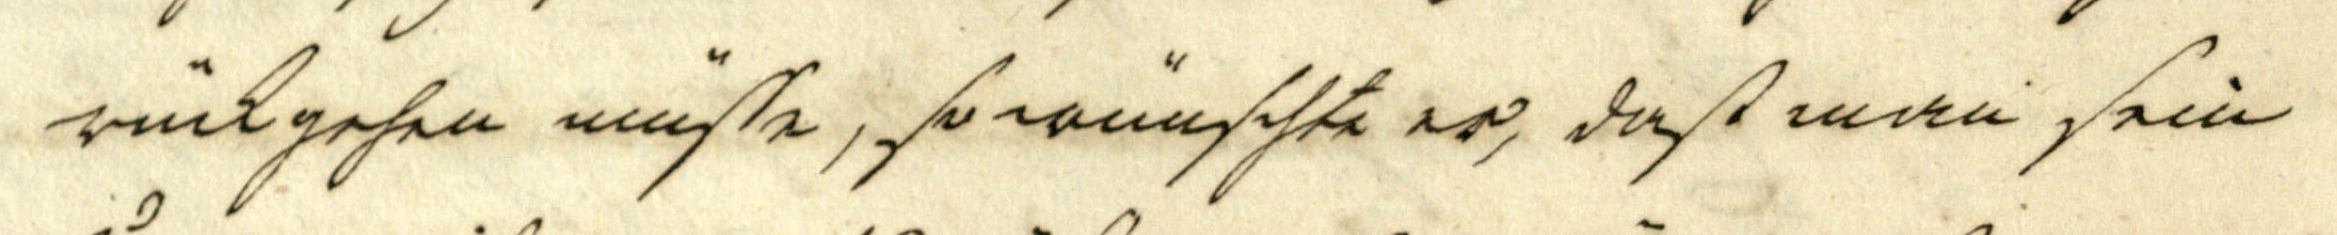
rückgehen müsse, so wünschte er, daß man sein
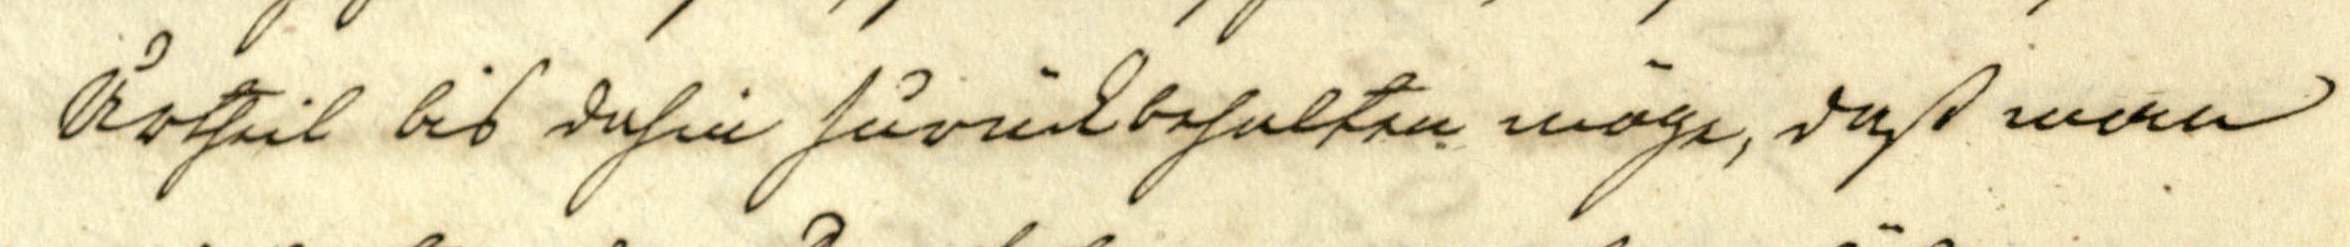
Urtheil bis dahin zurückbehalten möge, daß man
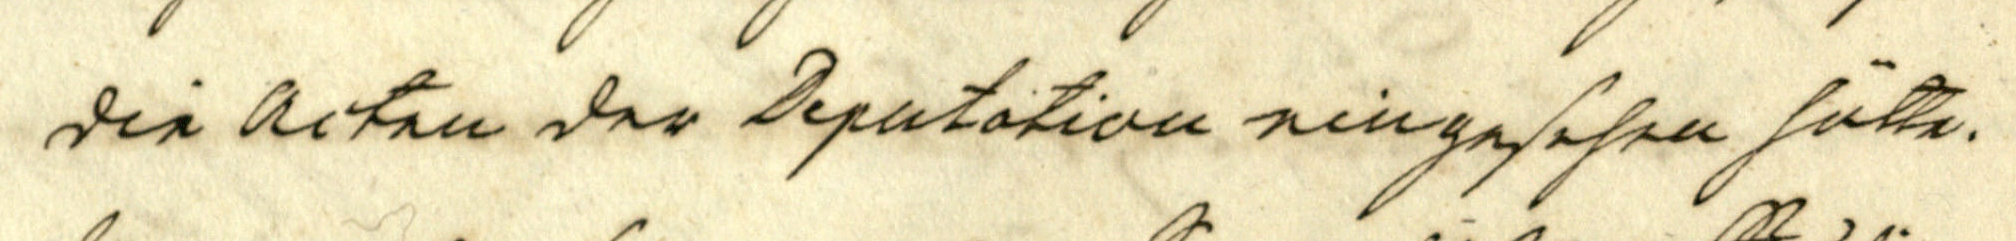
die Acten der Deputation eingesehen hätte.
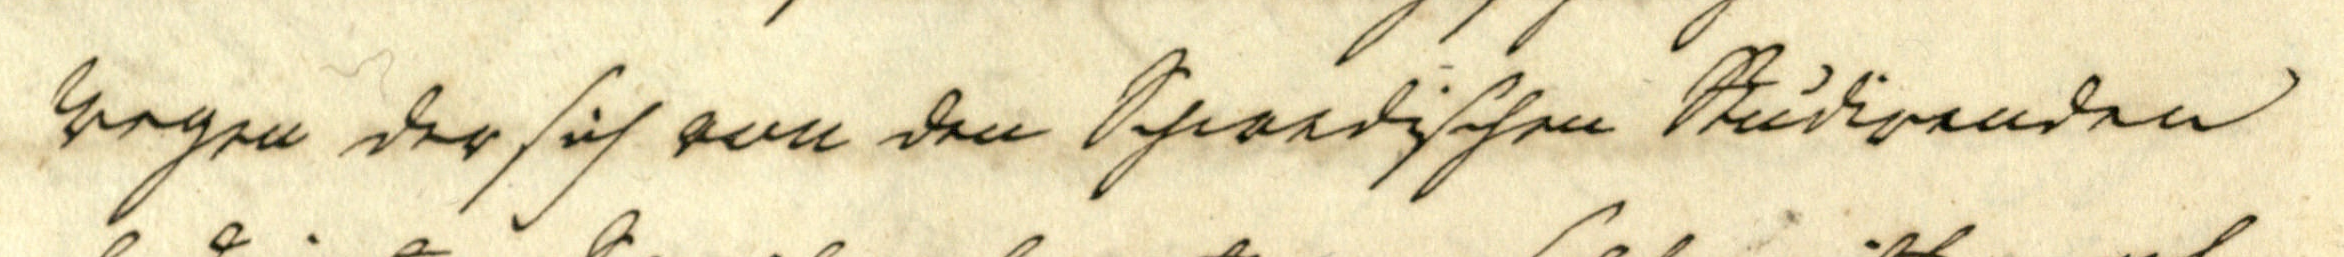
Wegen der sich von den Schwedischen Studirenden
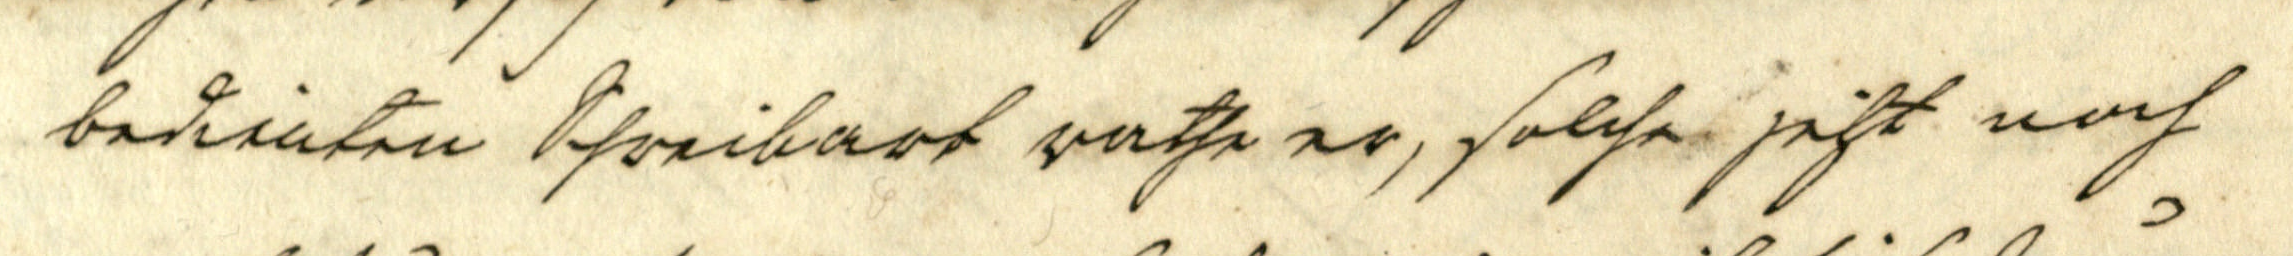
bedienten Schreibart rathe er, solche jetzt noch
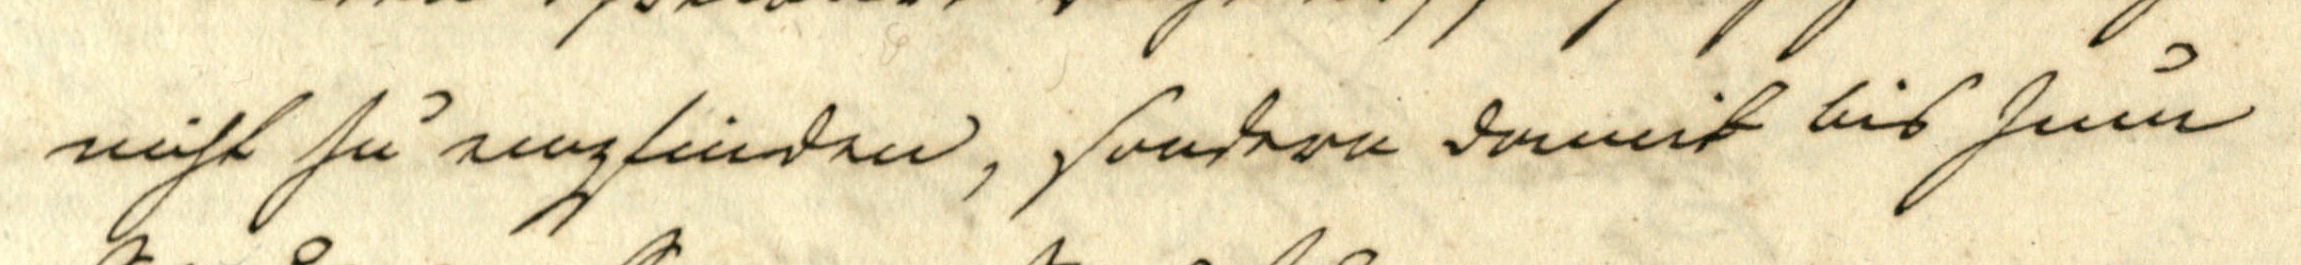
nicht zu empfinden, sondern damit bis zum
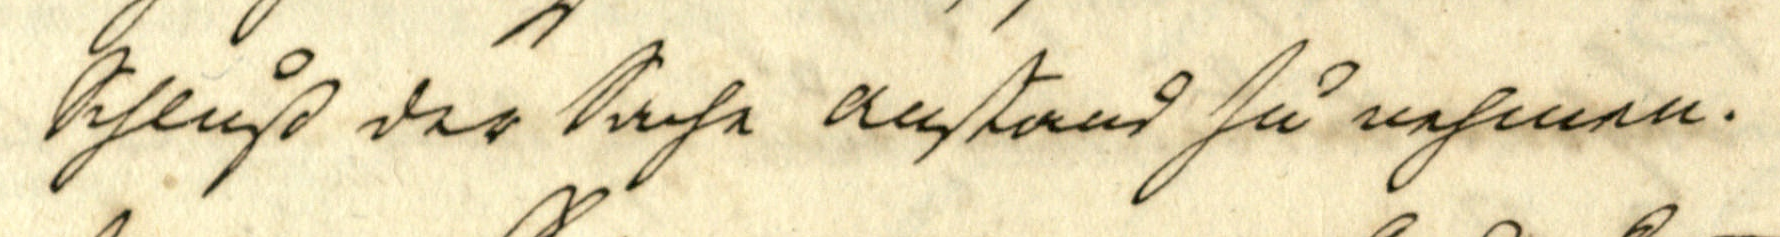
Schluß der Sache Anstand zu nehmen.
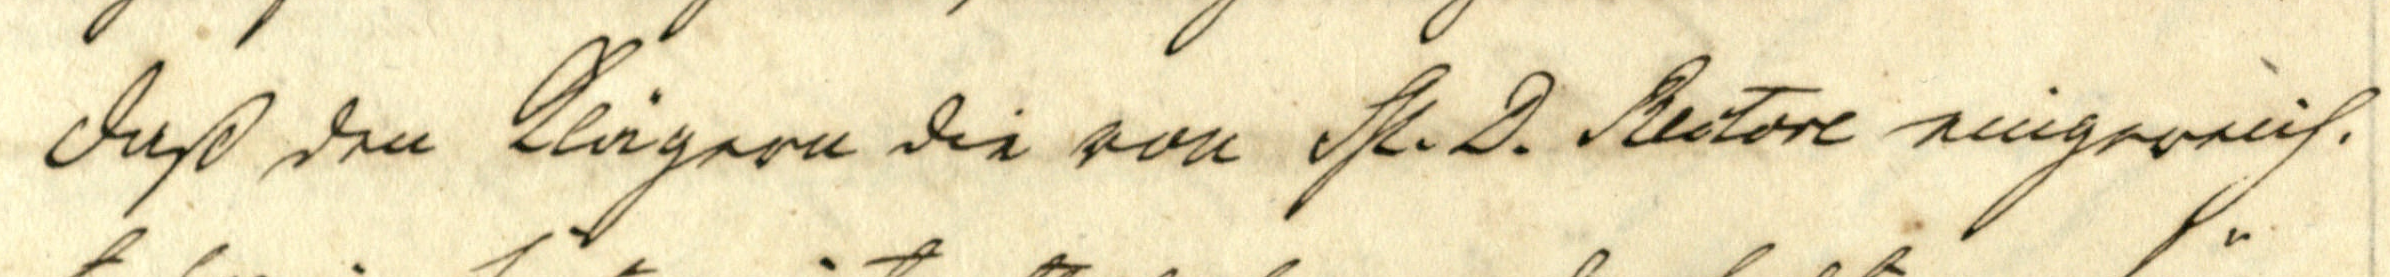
Daß den Klägern die von M. D. Rectore eingereich¬
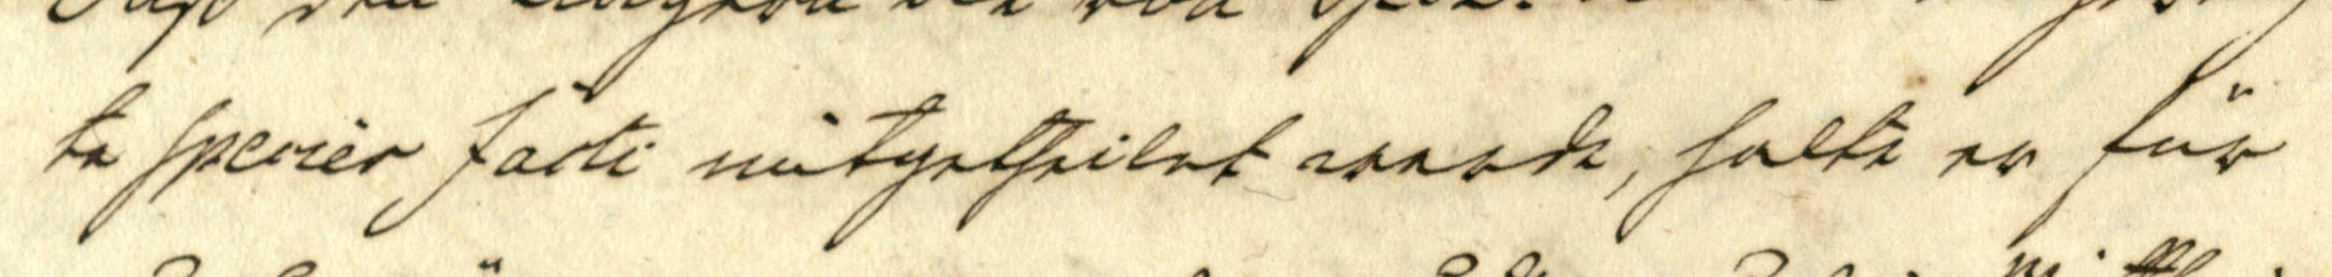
te species Facti mitgetheilet werde, halte er für¬
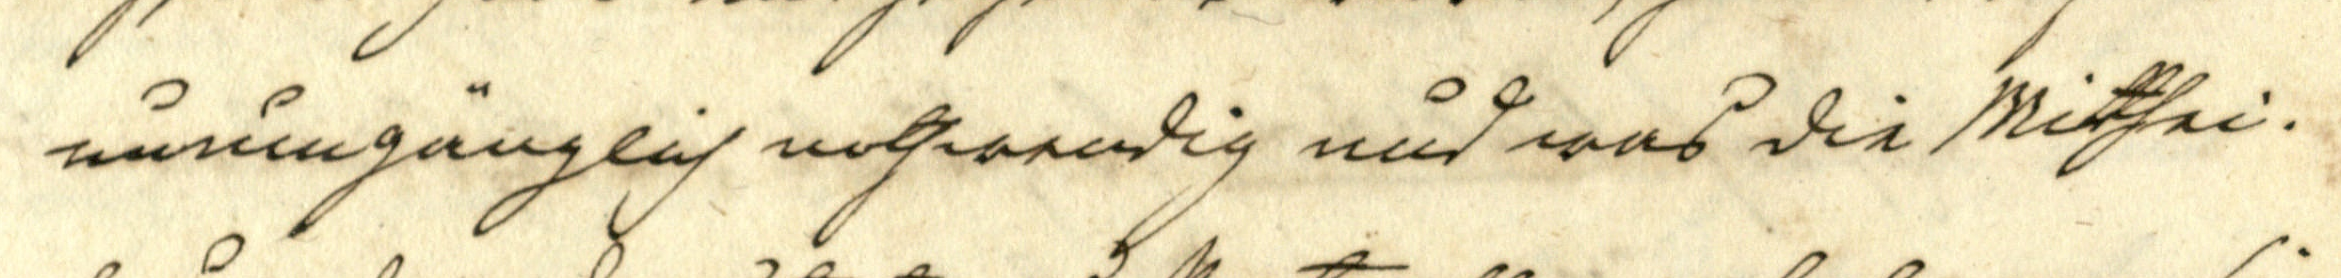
unumgänglich nothwendig und was die Mitthei¬
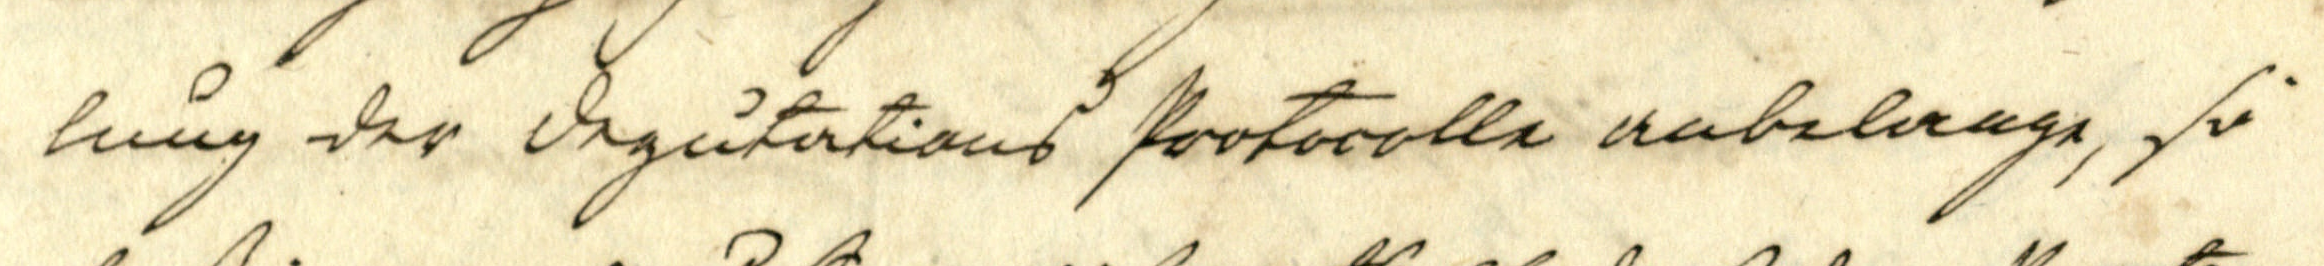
lung der Deputations Protocolle anbelange, so
